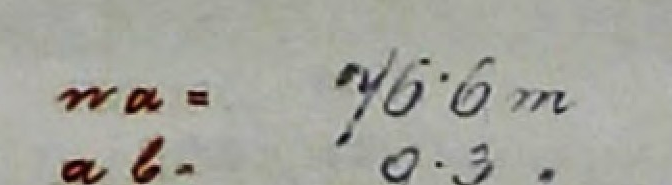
wa = 76.6m
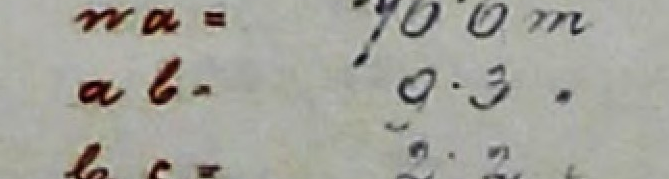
a b = 9.3 „
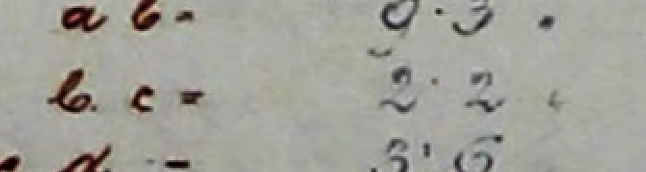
b. c = 2.2. „
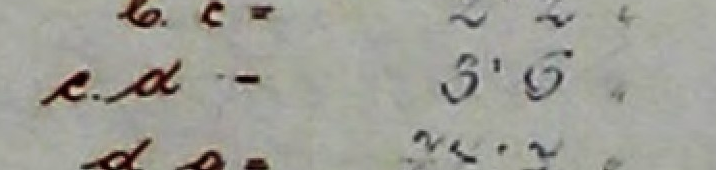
c.d = 5.6 „
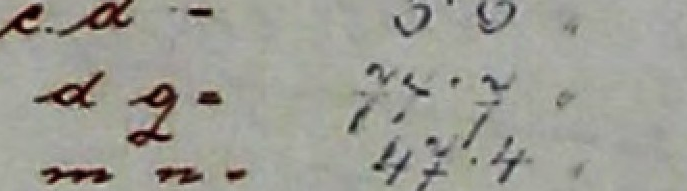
d q = 74.7 „
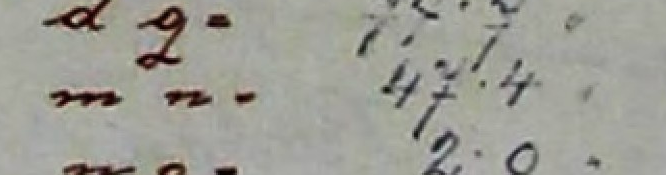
m n = 47.4 „
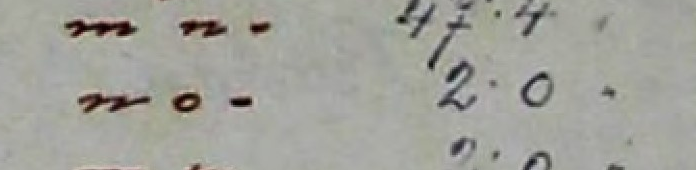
n o = 2.0 „
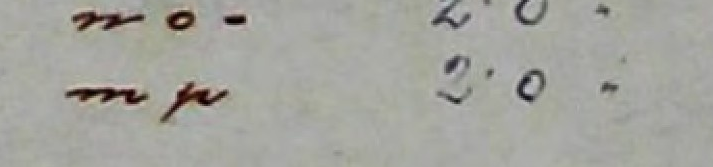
m p 2.0 „
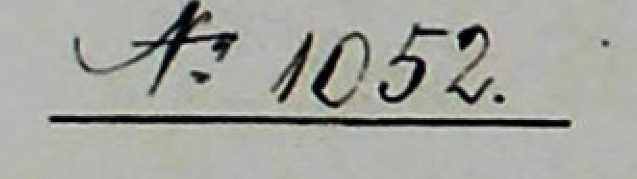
Nr 1052.
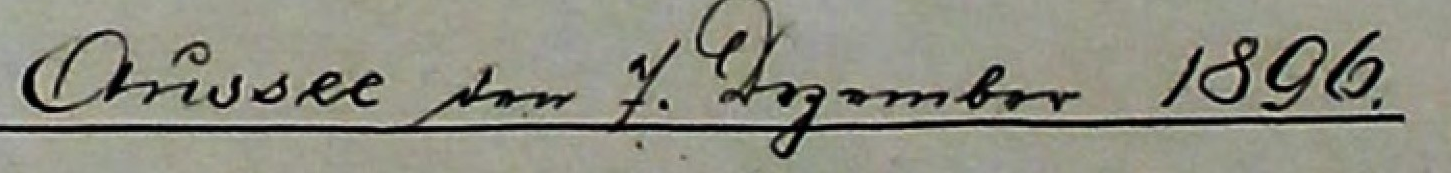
Aussee den 7. Dezember 1896.
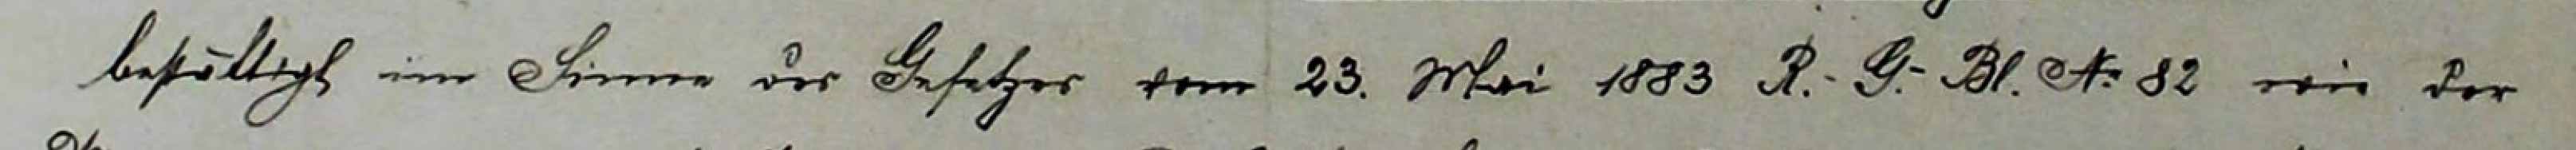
besttätigt im Finne ??? Gesetzes vom 23. Mai 1883 R.-G.-Bl. Nr 82 wie der
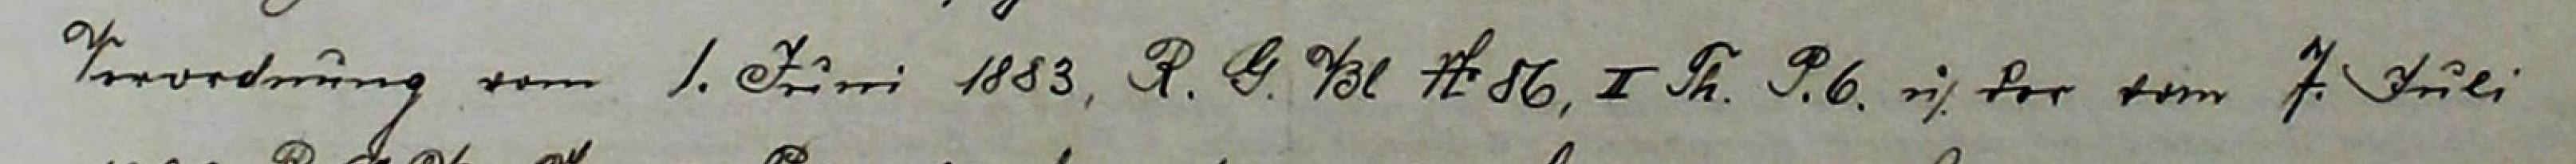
Verordnung vom 1. Juni 1883, R. G. Bl Nr 86, II Th. P. 6. ??? der vom 7. Juli
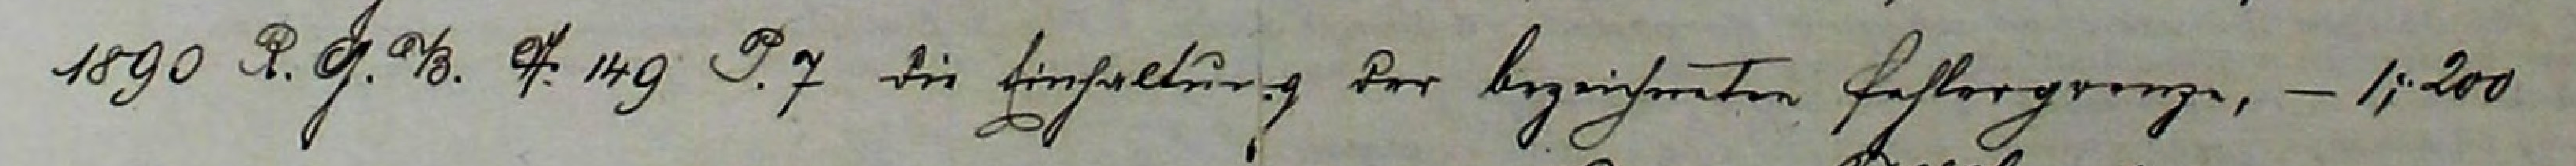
1890 R. G. B. Nr. 149 P. 7 die Einhaltung der Bezeichneten Fehlergrenze, — ?j. 200
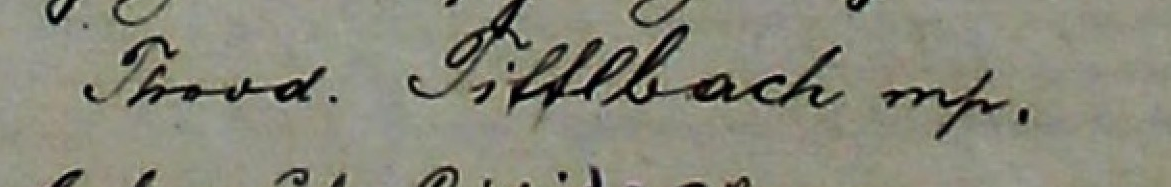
Throd. Tittlbach mp.
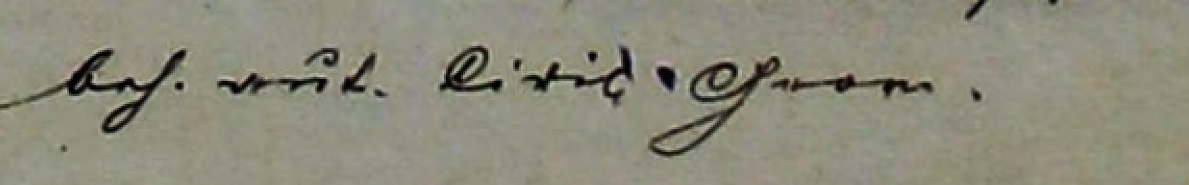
beh. aut. Livi?. Germ.
